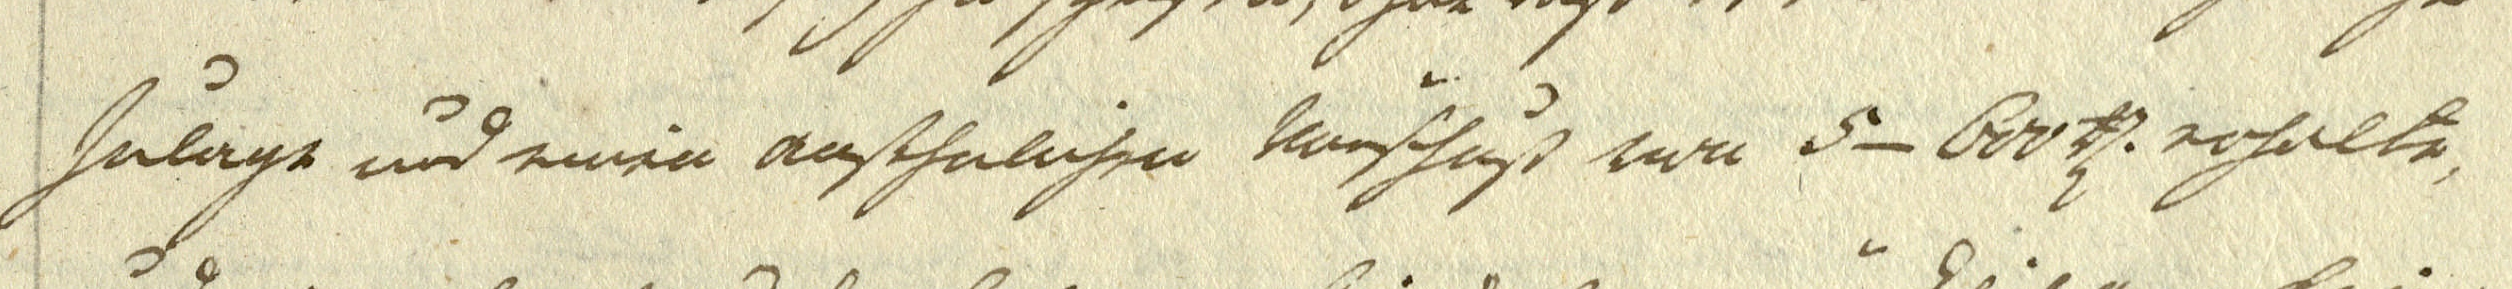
Zulage und einen ansehnlichen Vorschuß von 5 - 600 rt. erhalte,
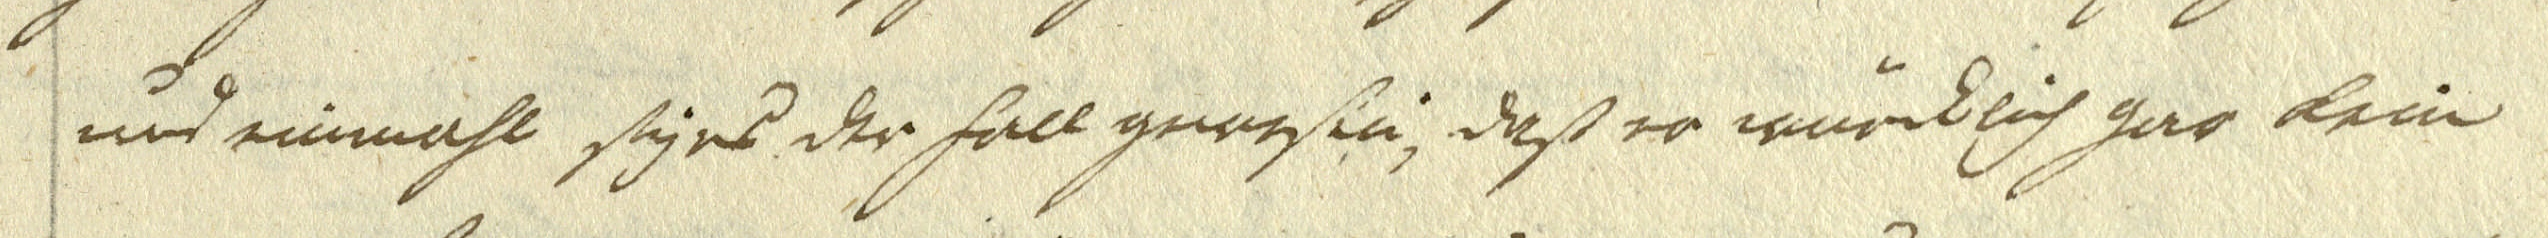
und einmahl seÿ es der Fall gewesen, daß er würcklich gar kein
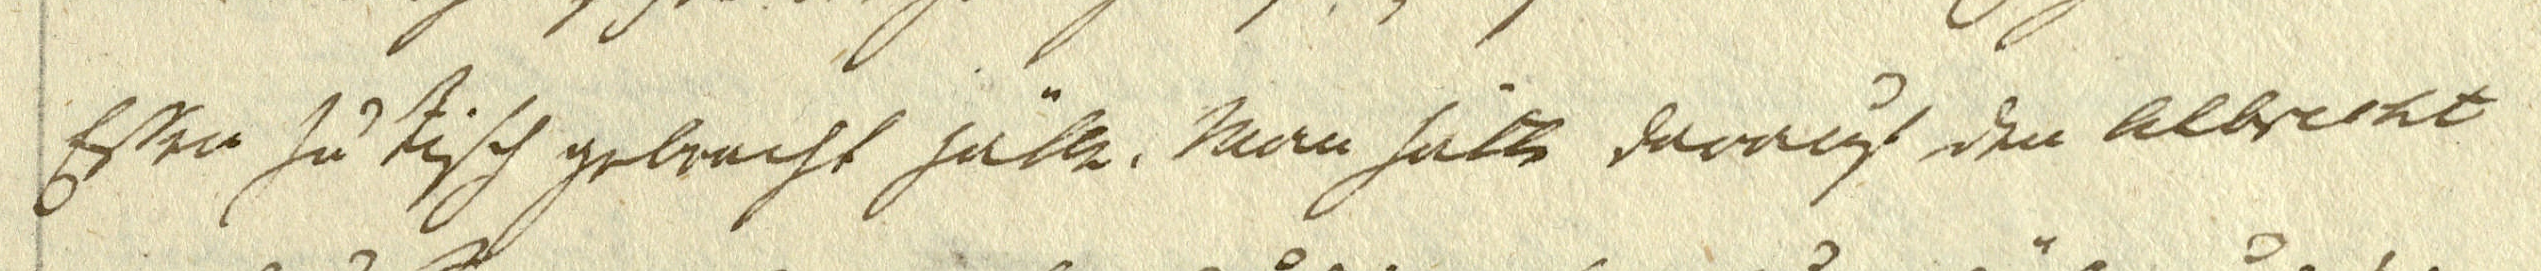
Essen zu Tisch gebracht hätte. Man hätte darauf den Albrecht
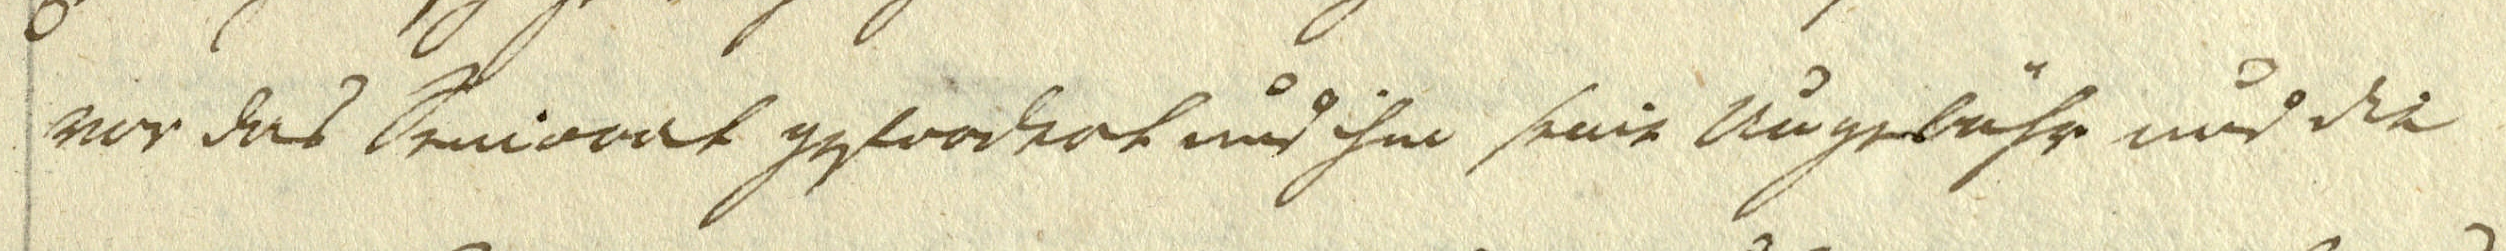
vor das Seniorat gefordert und ihm seine Ungebühr und die
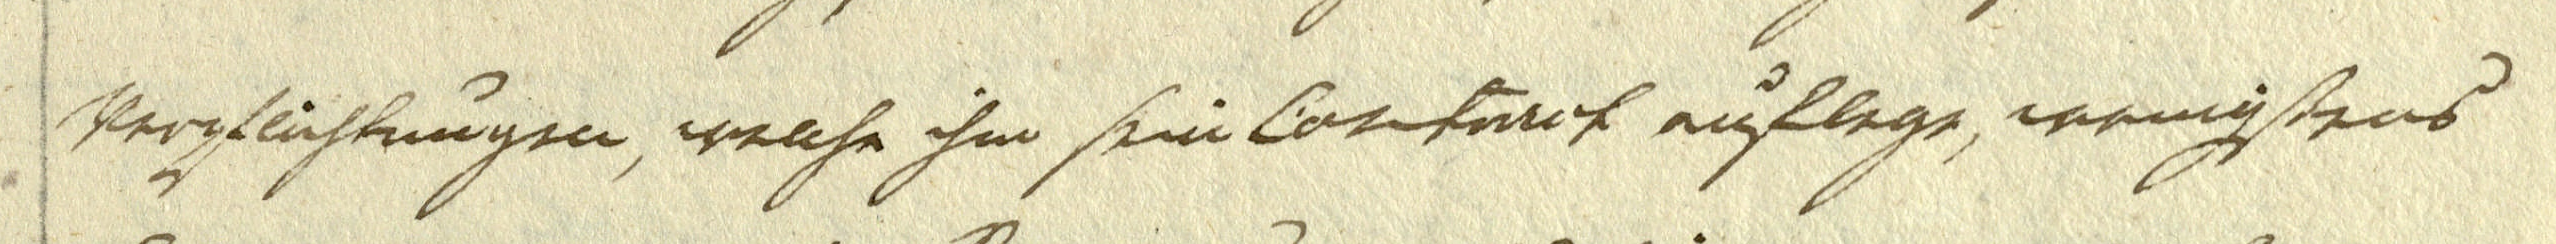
Verpflichtungen, welche ihm sein Contract auflege, wenigstens
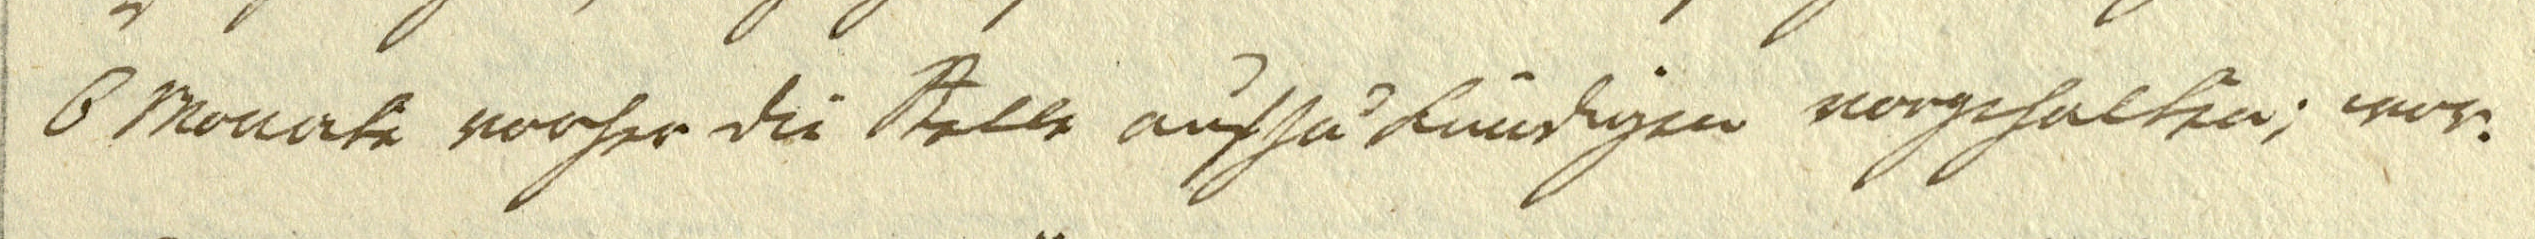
6 Monate vorher die Stelle aufzukündigen vorgehalten; wor¬
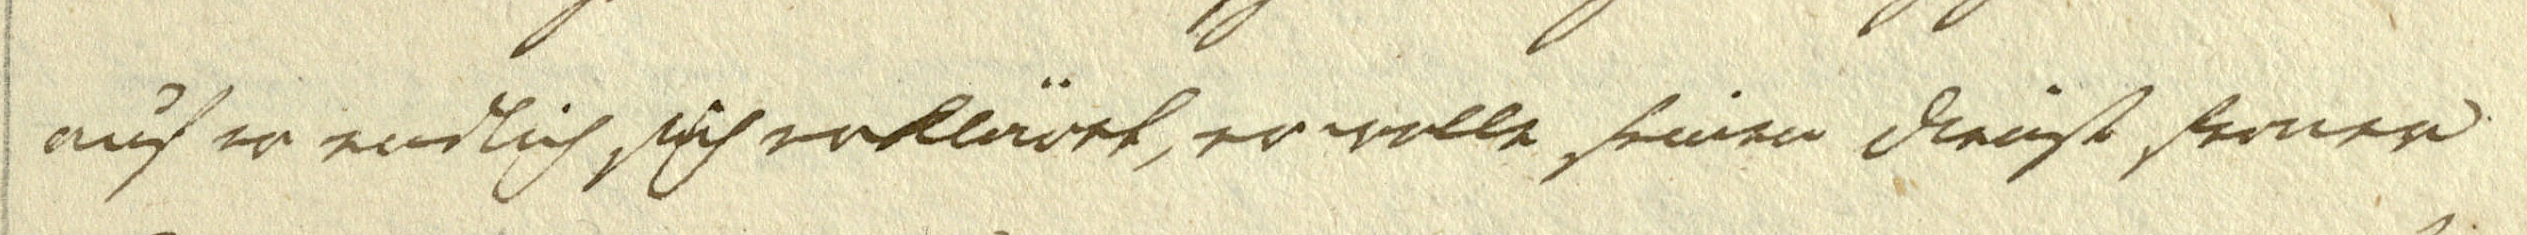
auf er endlich sich erkläret, er wolle seinen Dienst ferner
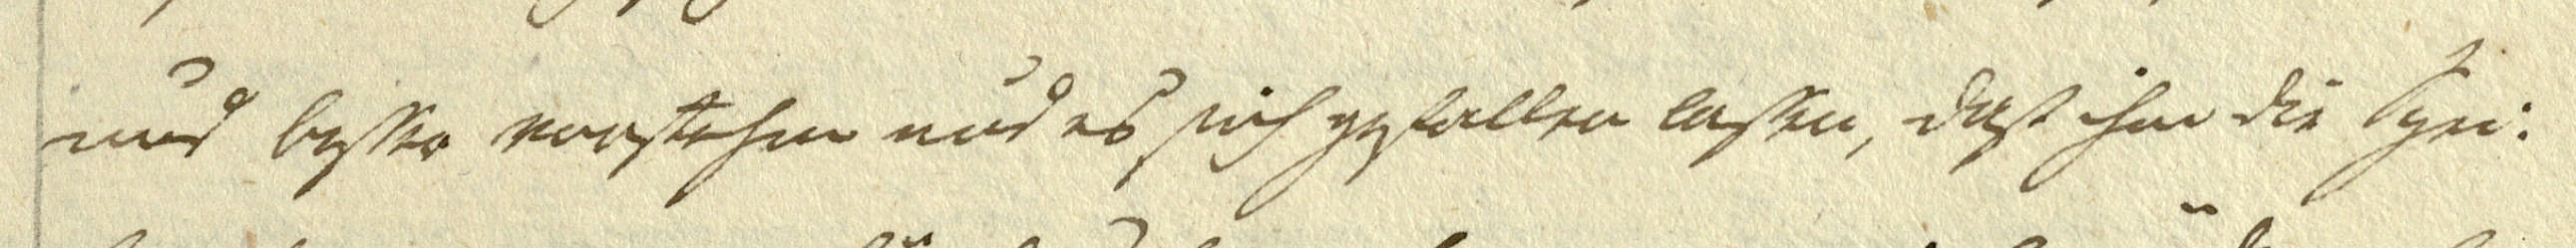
und besser vorstehen und es sich gefallen lassen, daß ihm die Spei¬
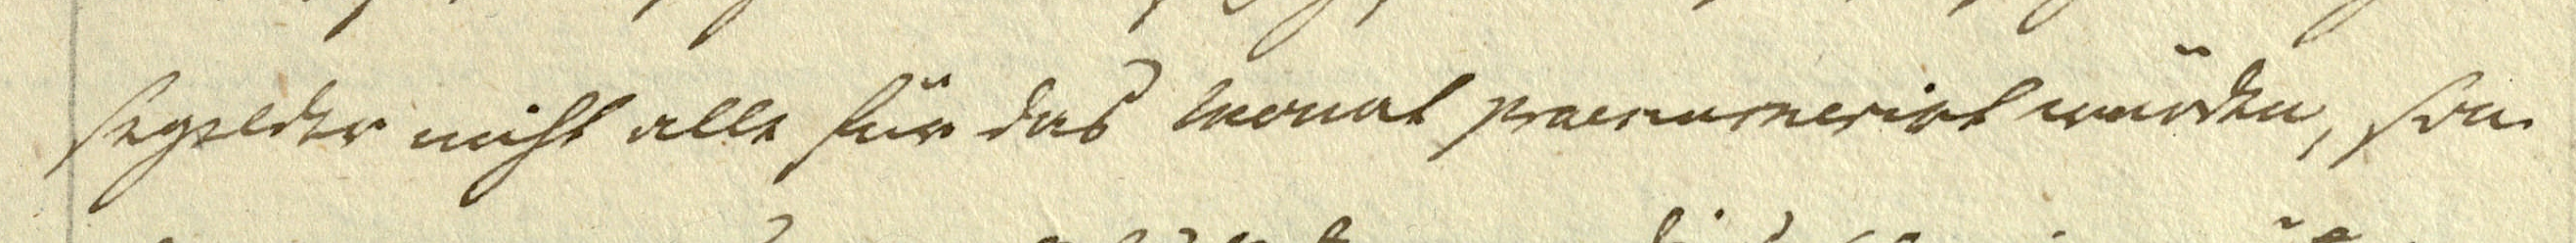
segelder nicht alle für das Monat praenumerirt würden, son¬
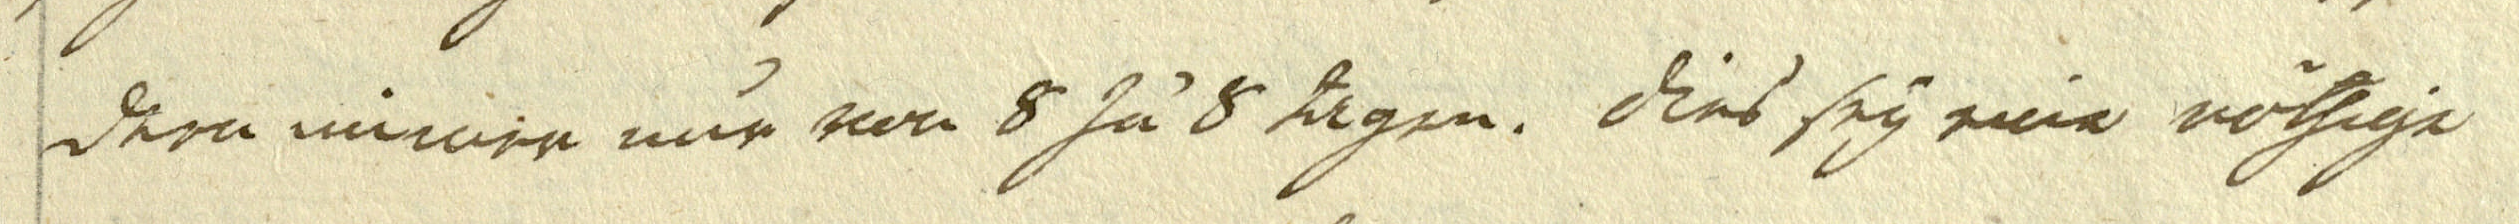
dern immer nur von 8 zu 8 Tagen. Dies seÿ eine nöthige
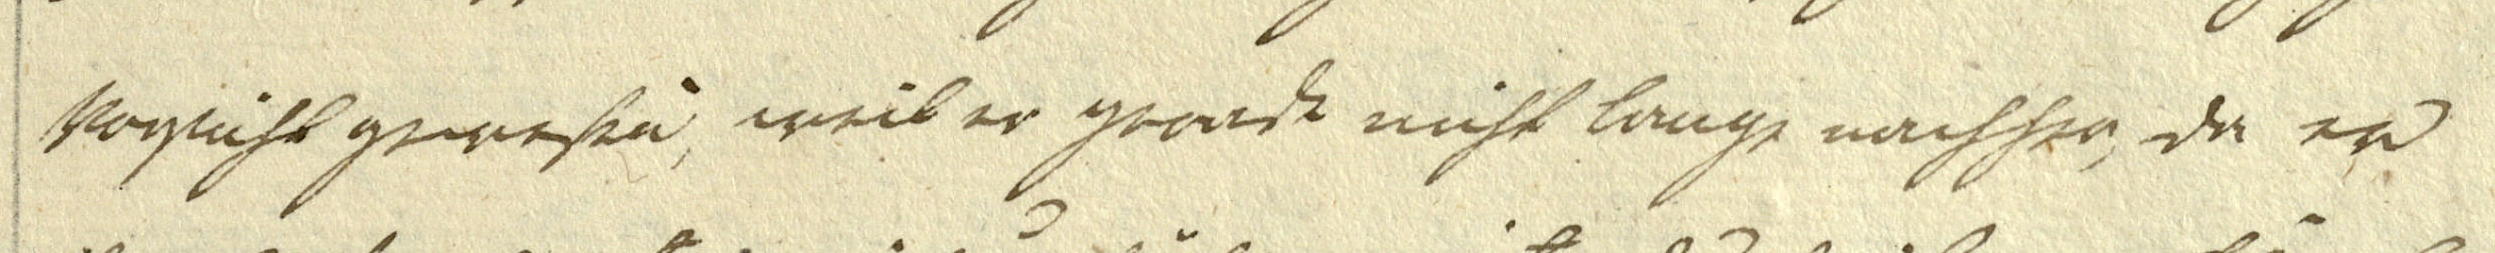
Vorsicht gewesen, weil er gerade nicht lange nachher, da er
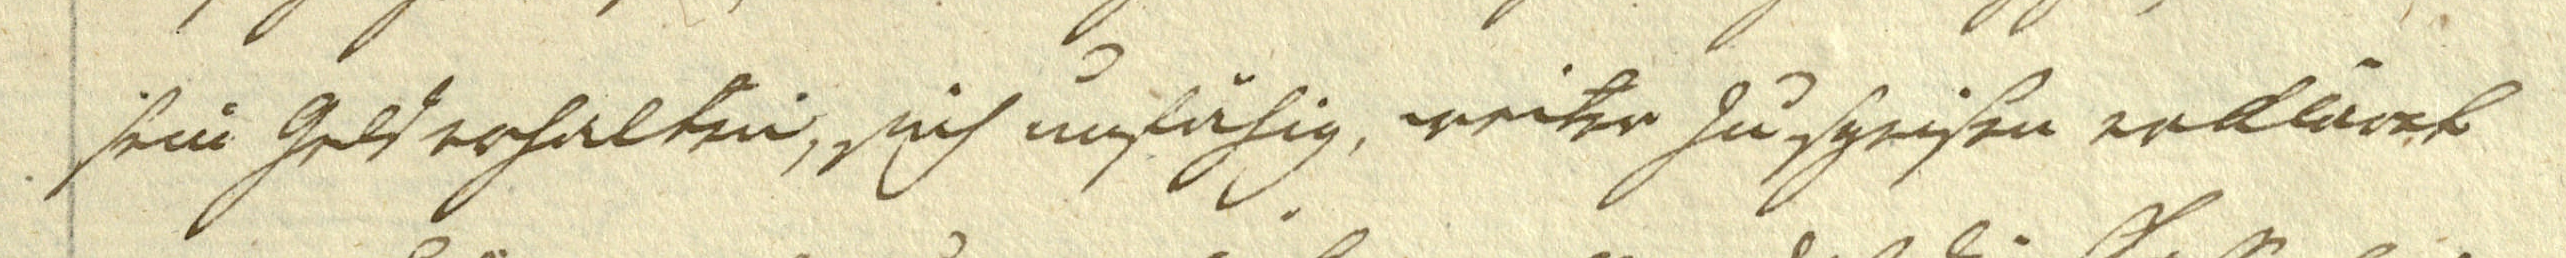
sein Geld erhalten, sich unfähig, weiter zu speisen erkläret
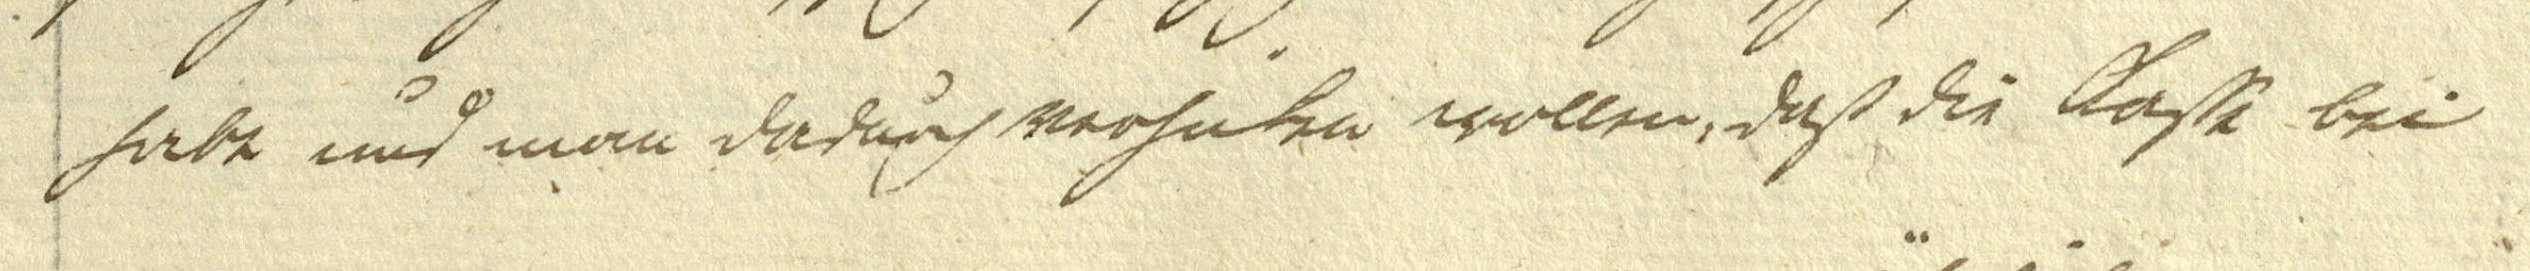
habe und man dadurch verhüten wollen, daß die Kasse bei
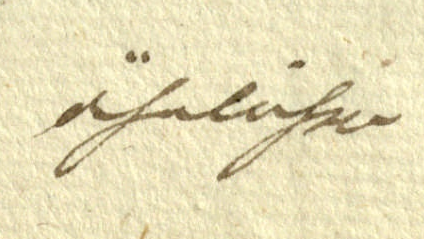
ähnlichen
